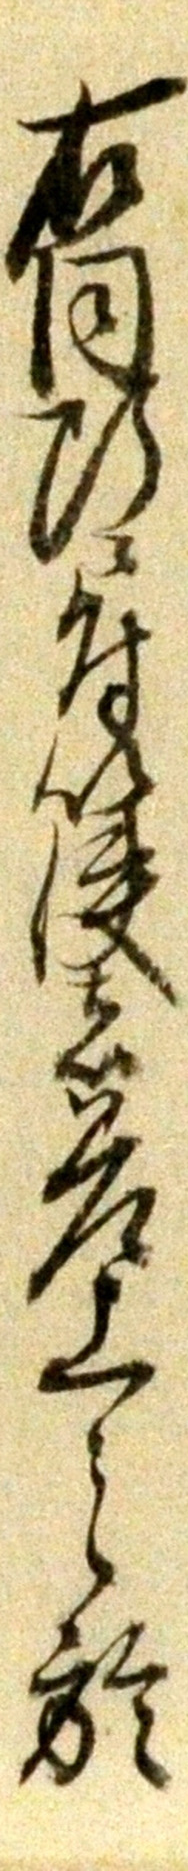右同断ニ付以使者差上之於
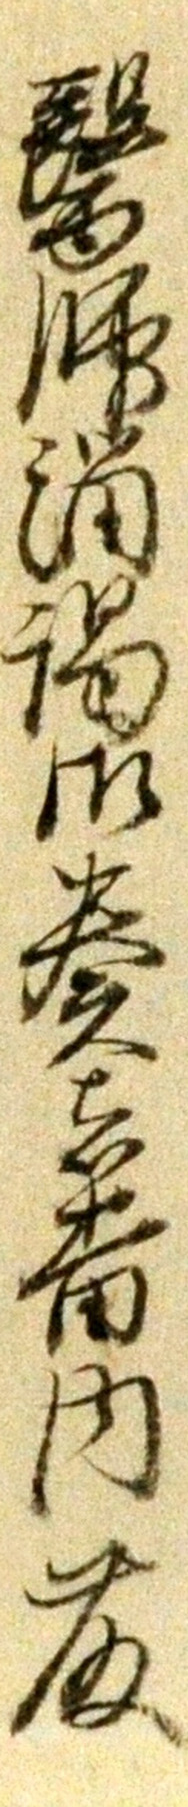医師溜謁御奏者番内藤
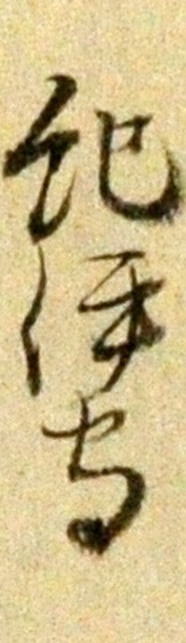紀伊守
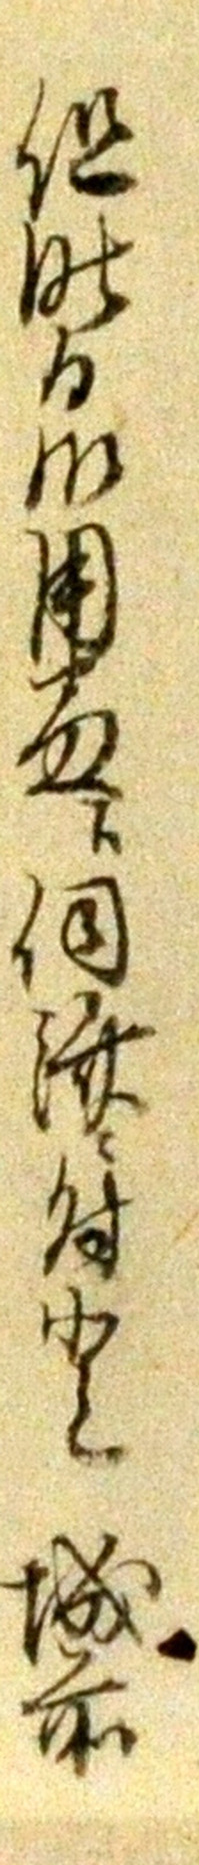但昨日御用番え伺済ニ付登城前
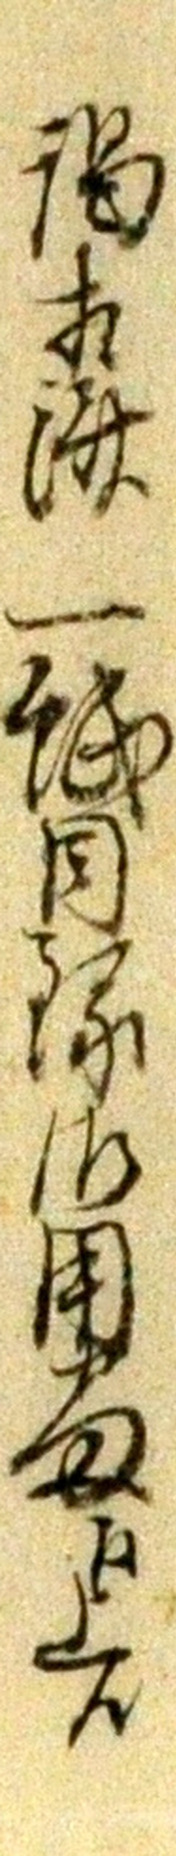謁相済一紙目録御用番え上ル
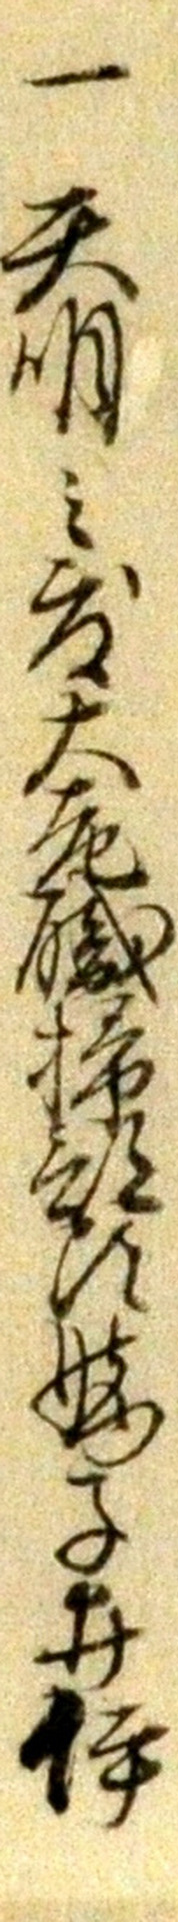一天明之度大老職掃部頭嫡子井伊
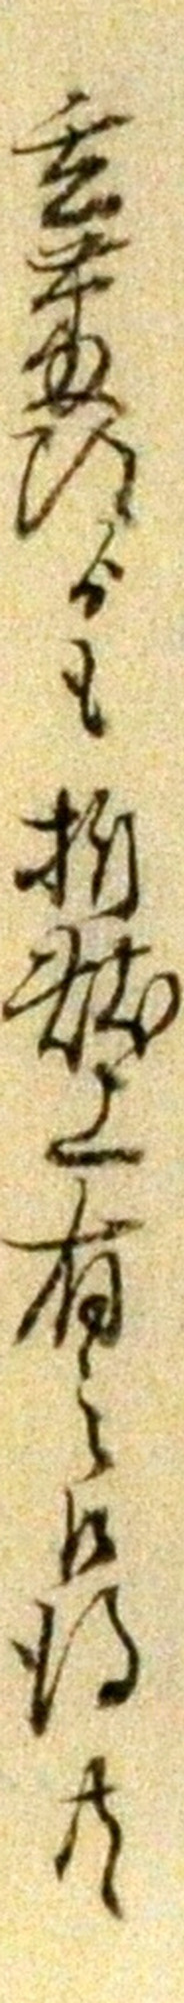玄蕃頭ゟも折献上有之候得共
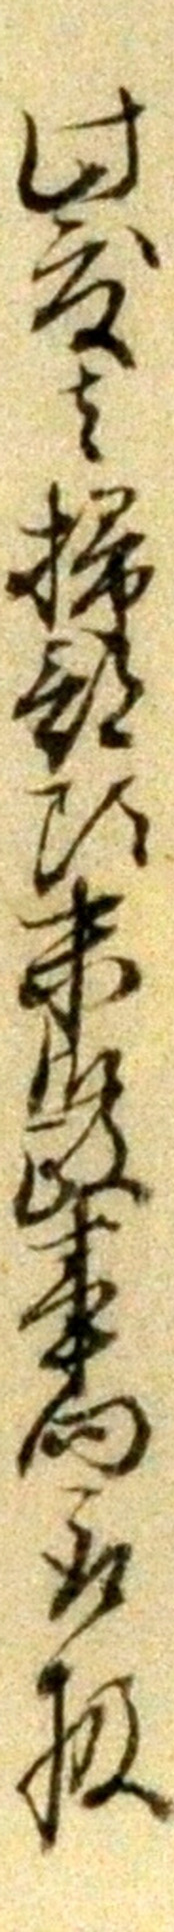此度は掃部頭未御政事向取扱
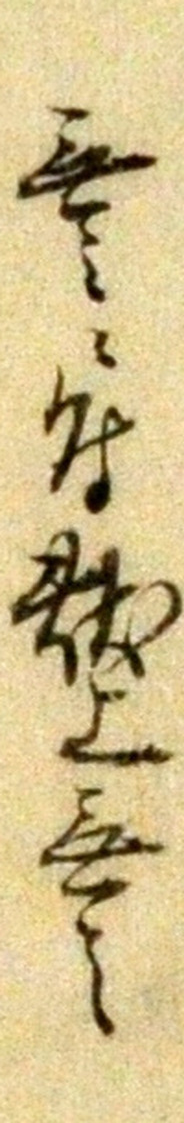無之ニ付献上無之
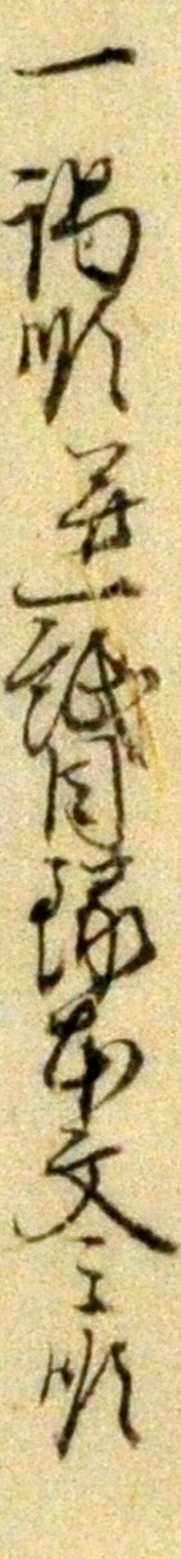一謁順并一紙目録本文之順
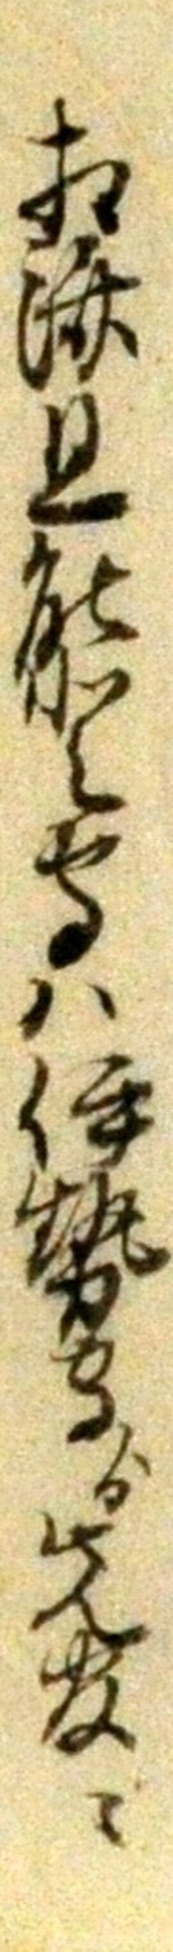相済且能登守ハ伊勢守ゟ先官ニ
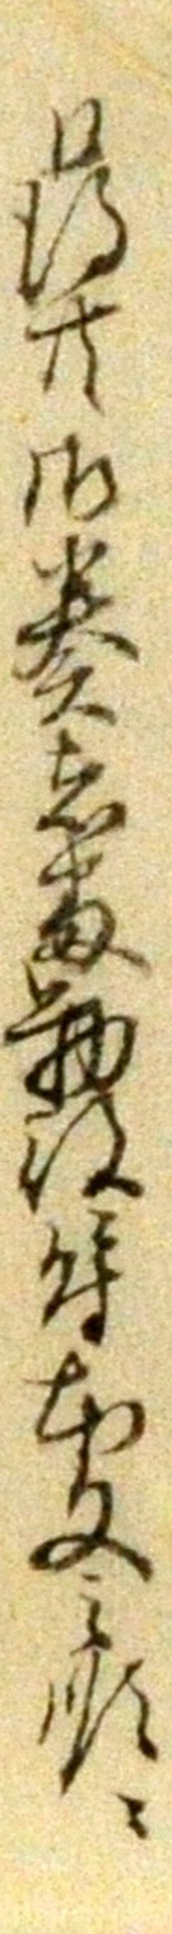候得共御奏者番勤役ニ付本文之順ニ
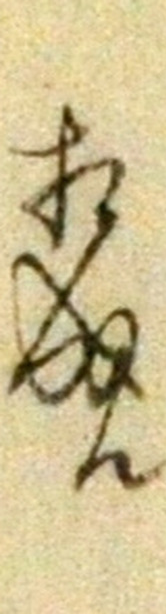相成ル
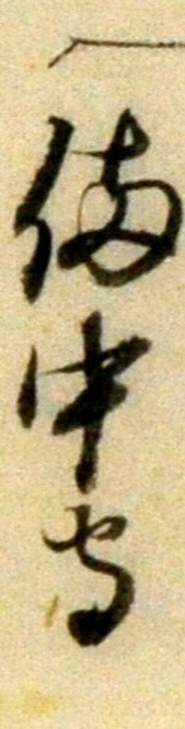備中守

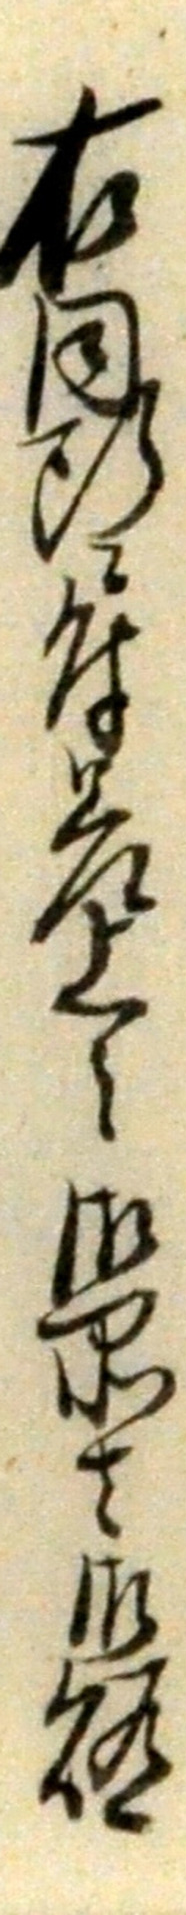右同断ニ付差上之御品は御賄
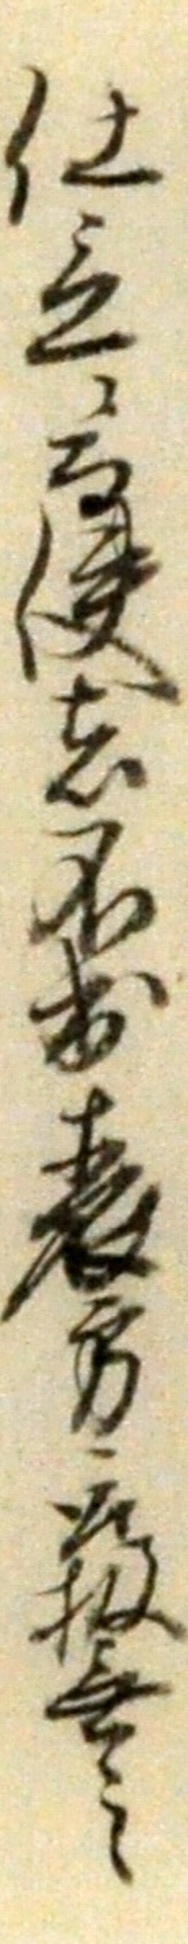仕立ニ而使者不出表方取扱無之
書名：御馳走御能ノ節ノ留外
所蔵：伊那市立高遠町図書館・合同会社AMANE
